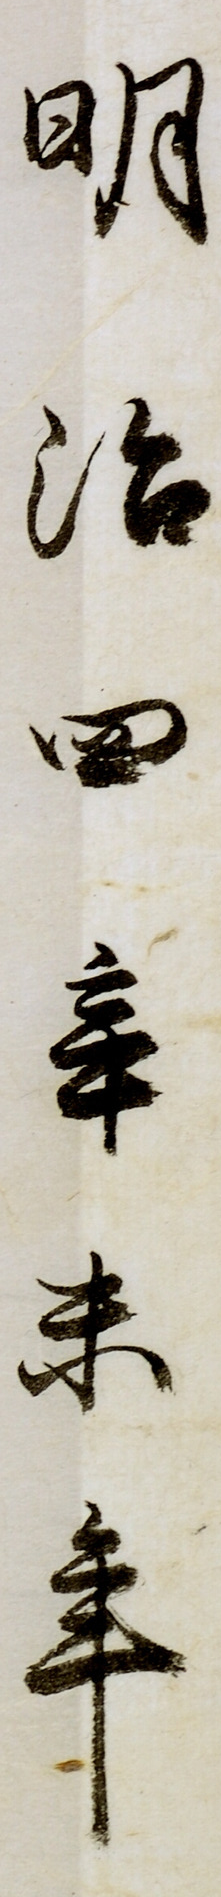明治四辛未年
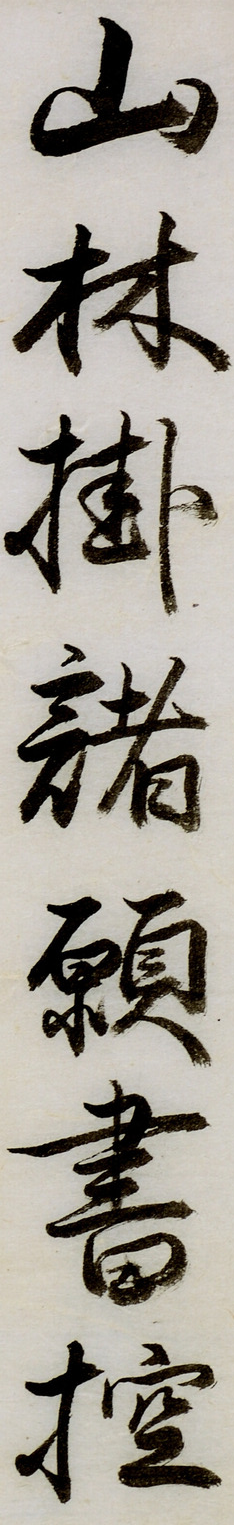山林掛諸願書控
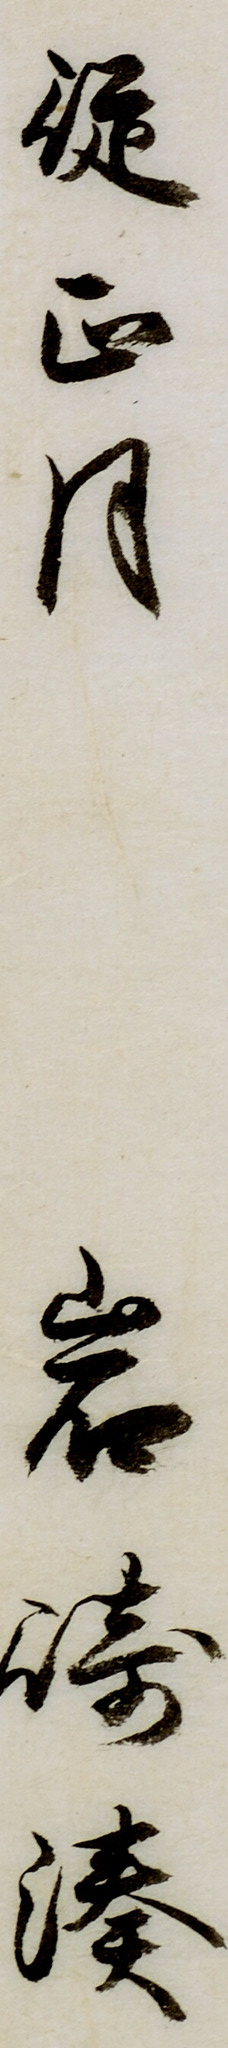従正月岩崎湊

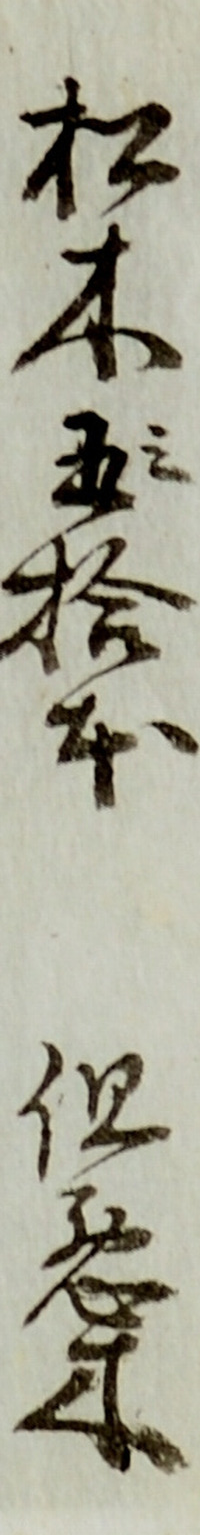松木三拾本但惣木
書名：山林掛諸願書控
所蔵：伊那市立高遠町図書館・合同会社AMANE
